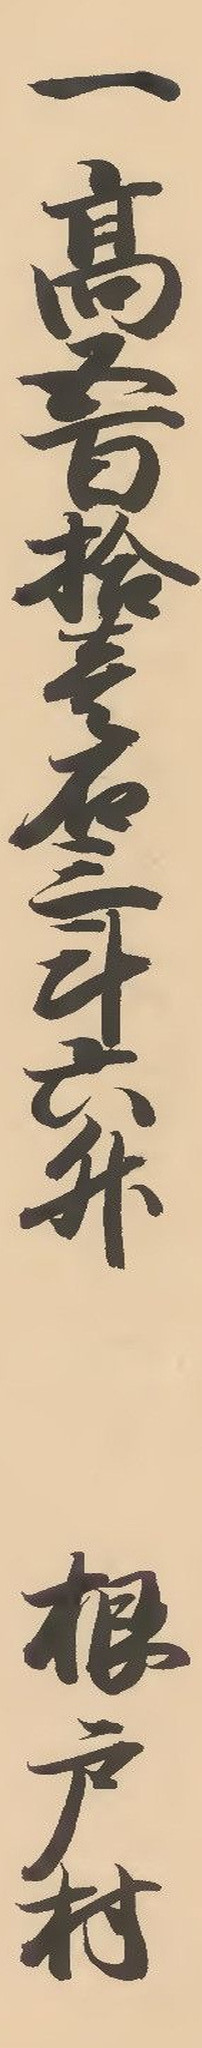一高五百拾壱石三斗六升根戸村
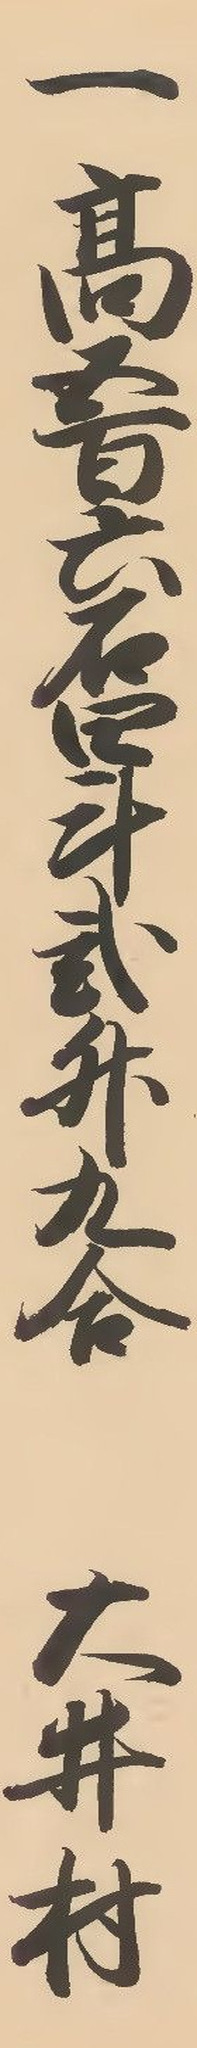一高五百六石四斗弐升九合大井村
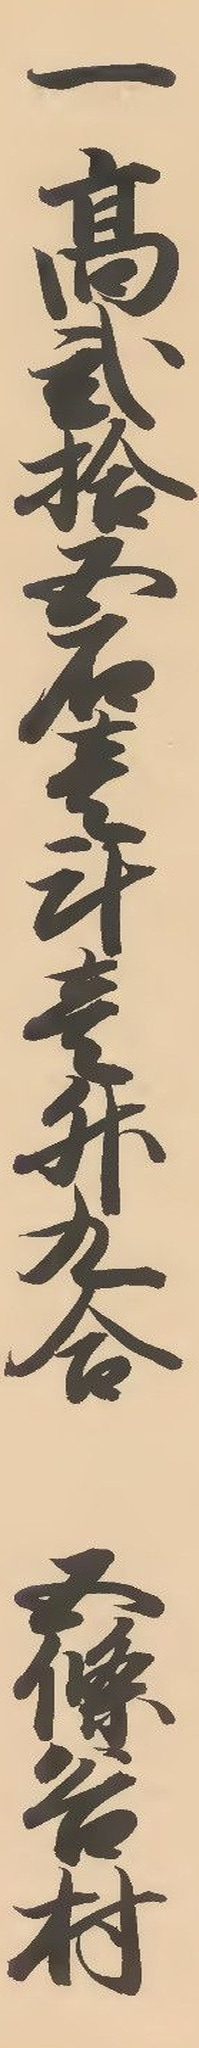一高弐拾五石壱斗壱升九合五条谷村
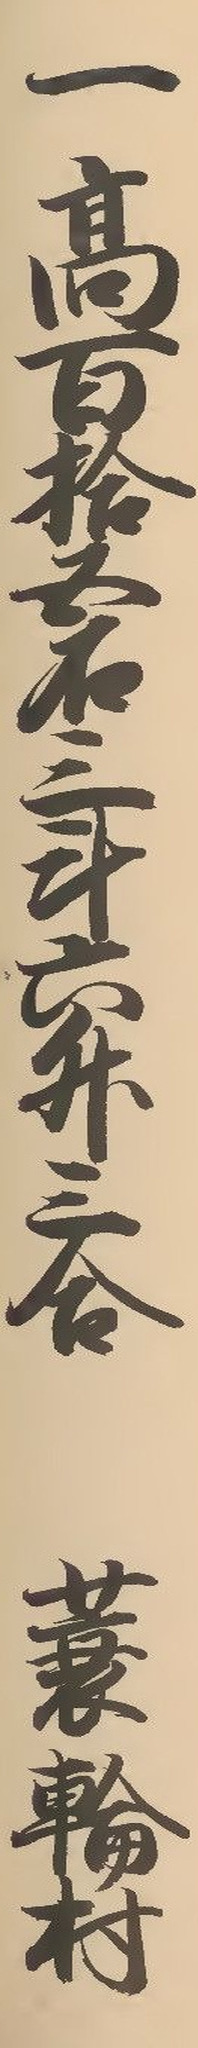一高百拾五石三斗六升三合蓑輪村
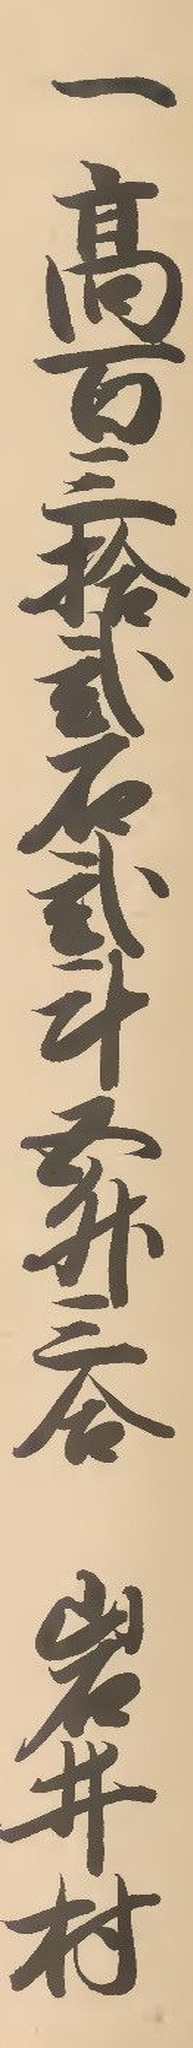一高百三拾弐石弐斗五升三合岩井村
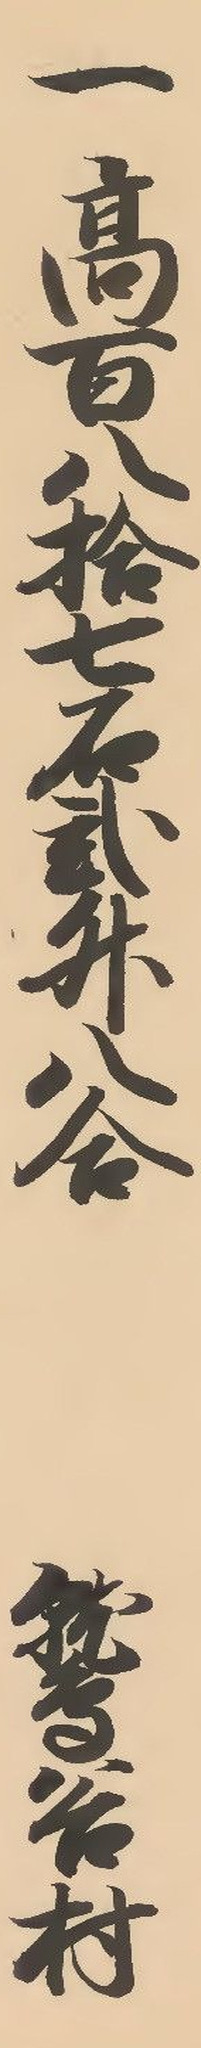一高百八拾七石弐升八合鷲谷村
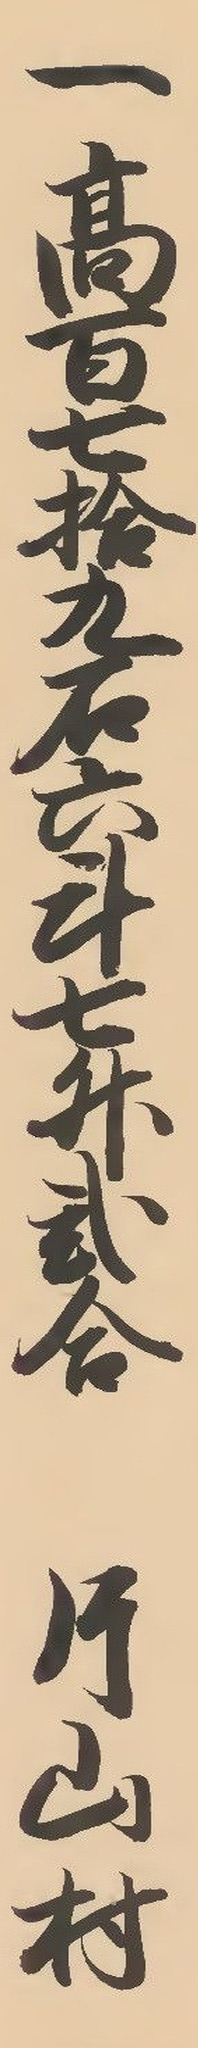一高百七拾九石六斗七升弐合片山村
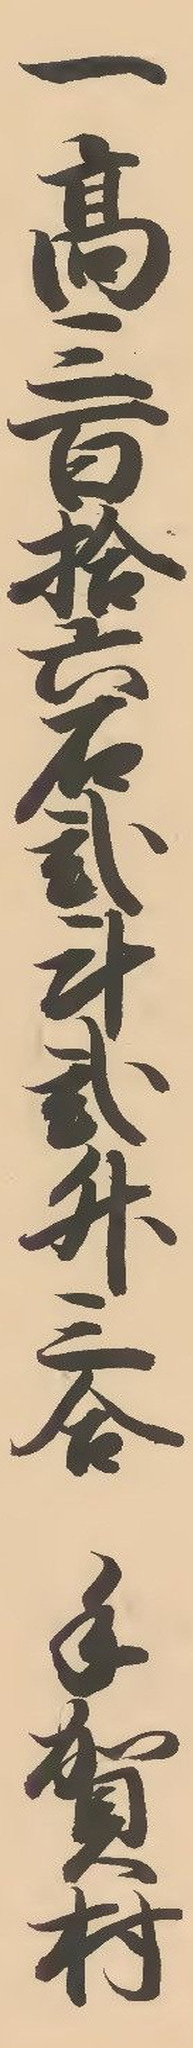一高三百拾六石弐斗弐升三合手賀村

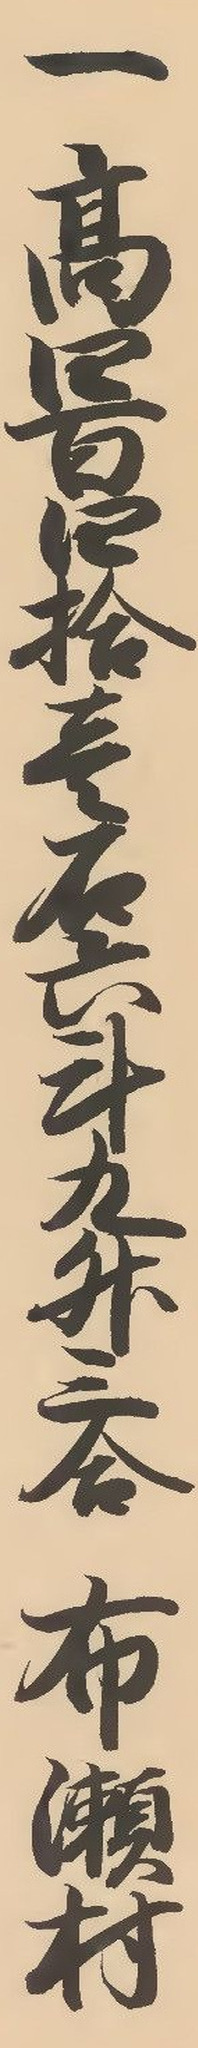一高四百四拾壱石六斗九升三合布瀬村
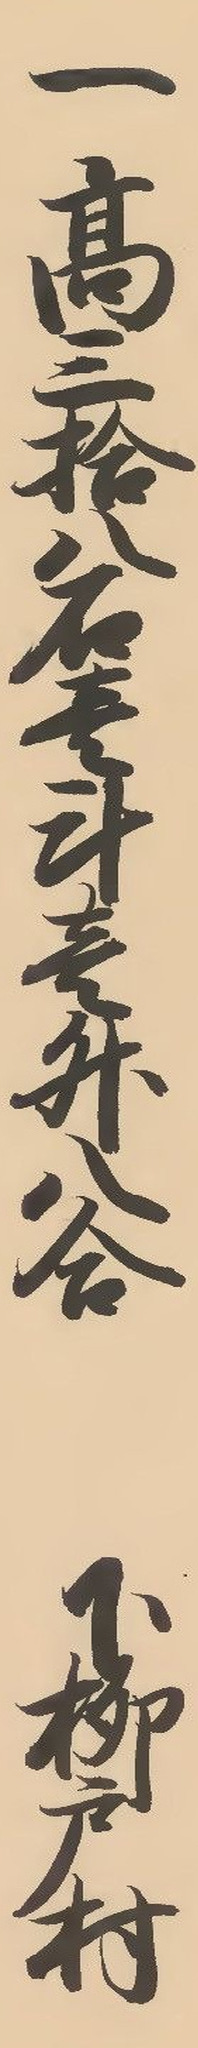一高三拾八石壱斗壱升八合下柳戸村
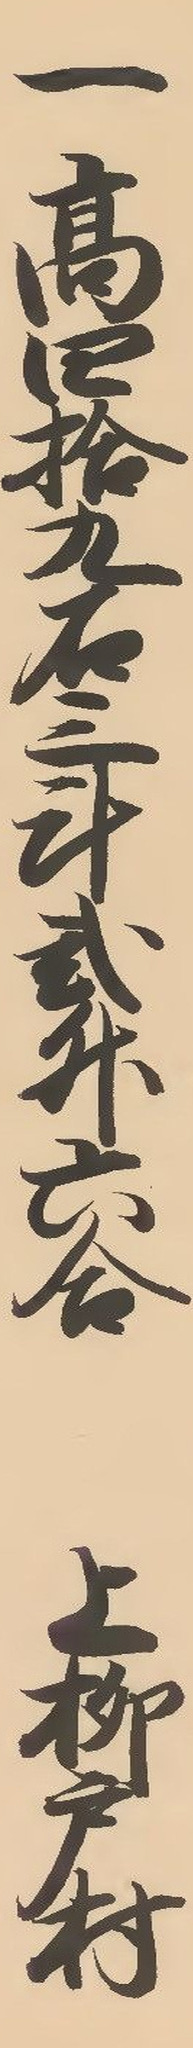一高四拾九石三斗弐升六合上柳戸村
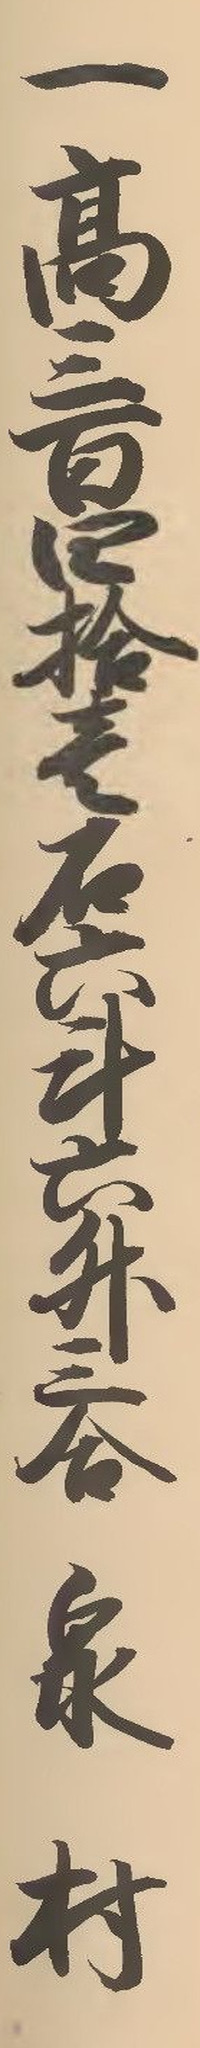一高三百四拾壱石六斗六升三合泉村
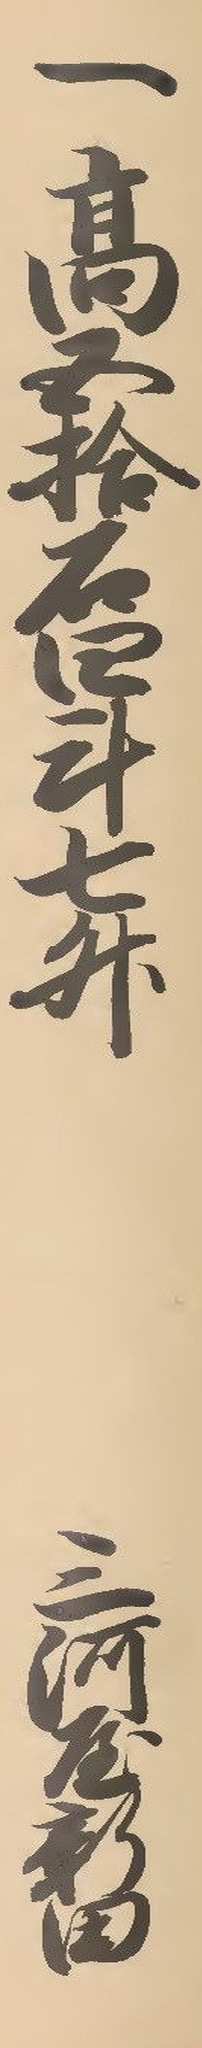一高五拾石四斗七升三河屋新田
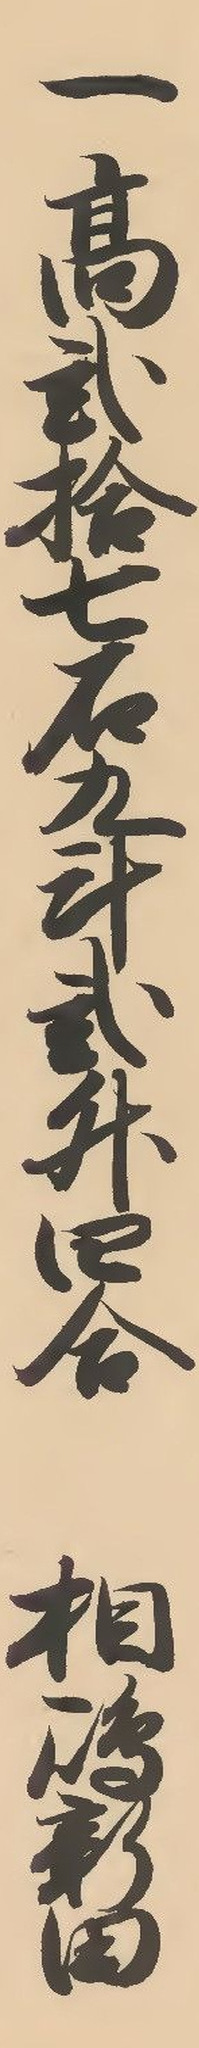一高弐拾七石九斗弐升四合相島新田
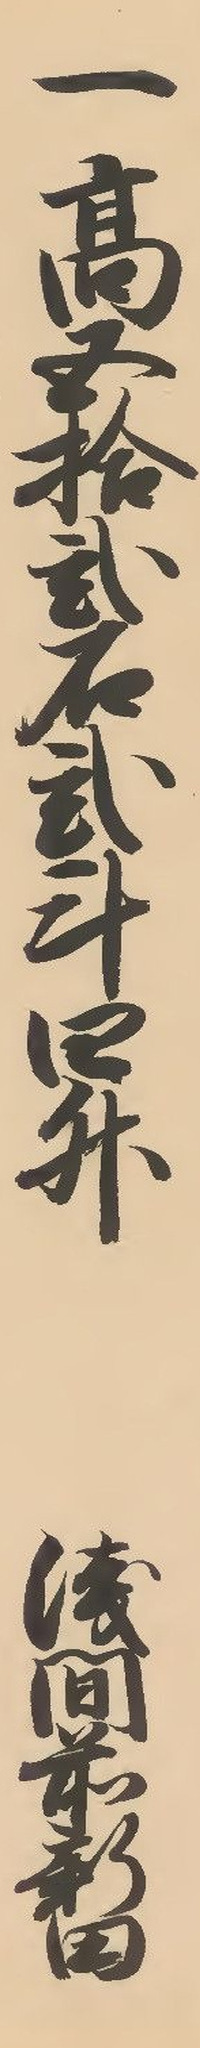一高五拾弐石弐斗四升浅間前新田
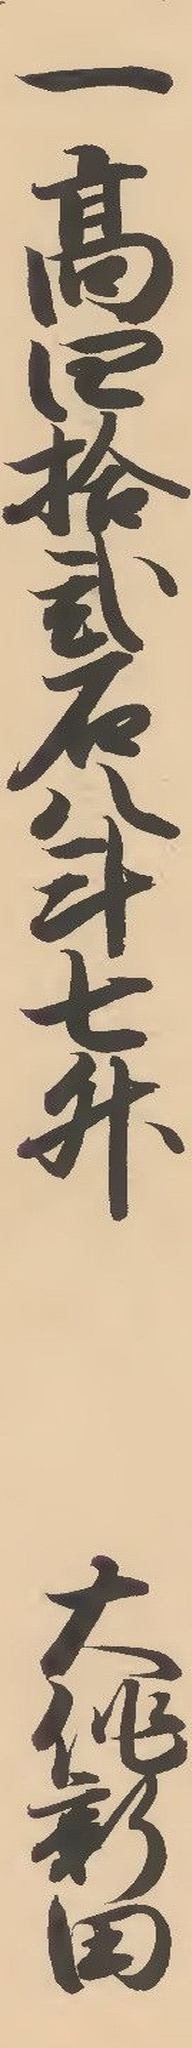一高四拾弐石八斗七升大作新田
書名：下総国郷帳
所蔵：国立公文書館 National Archives of Japan
